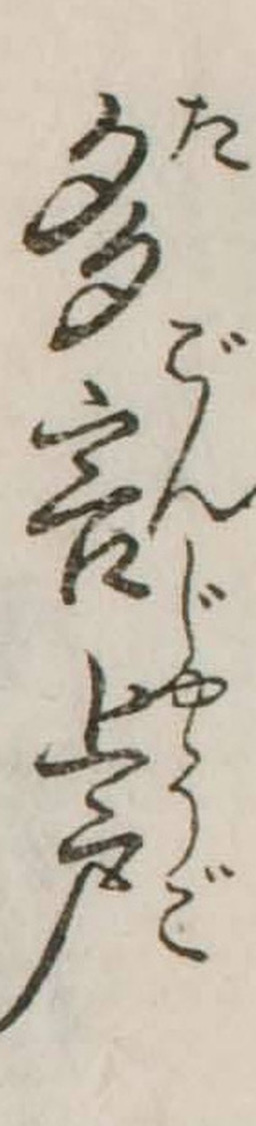多言上戸
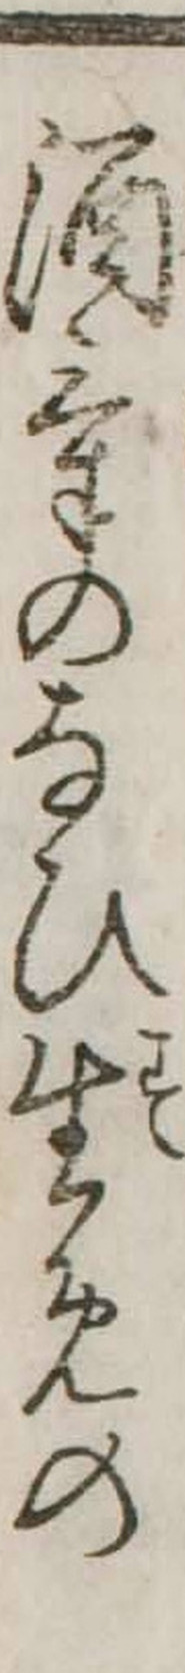酒気のなひ生めの
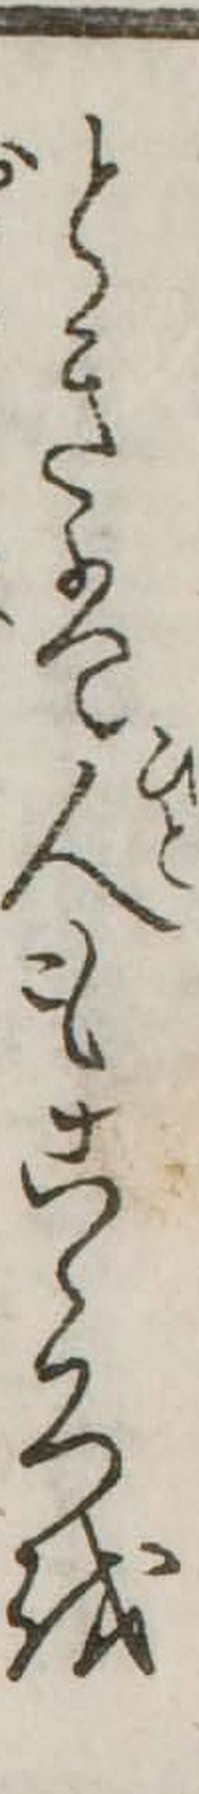ときは人もこゝろを
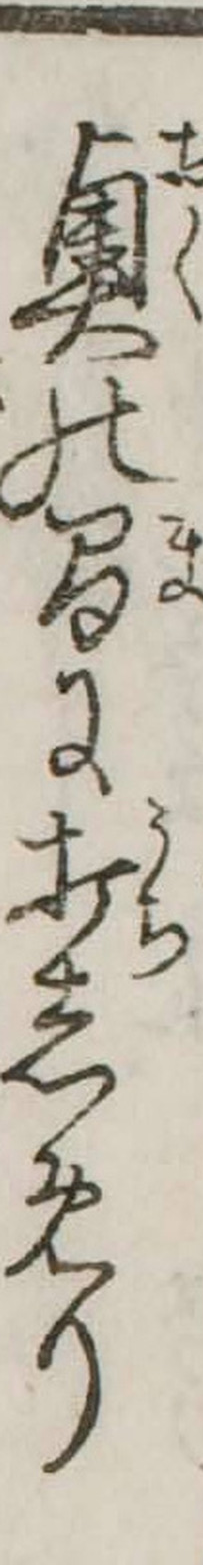奥の間に打しめり
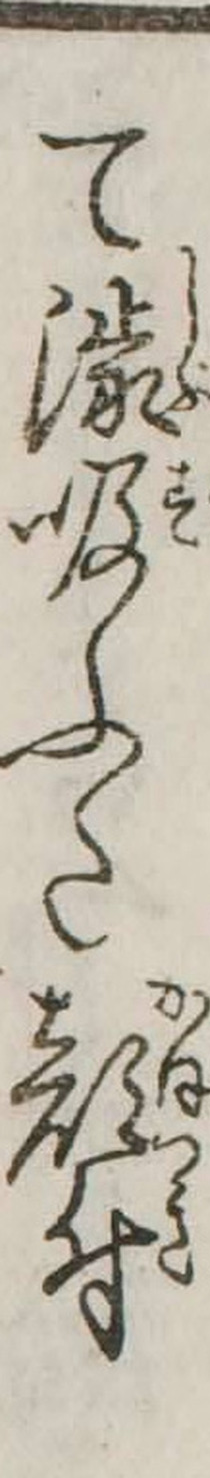て渋吸ふた顔付
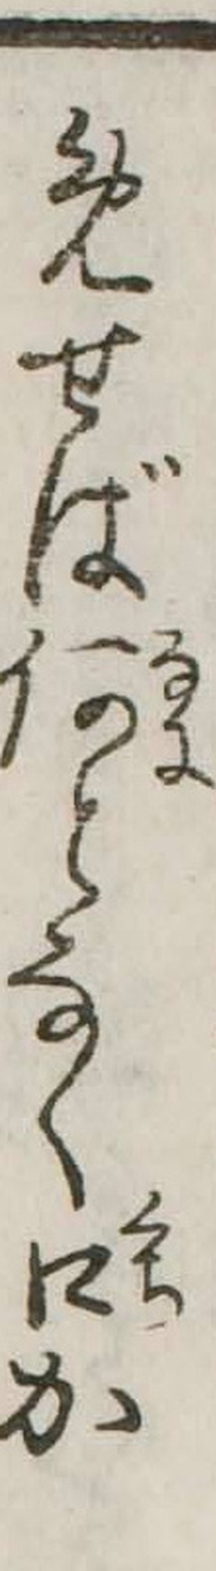めせば何となく口か
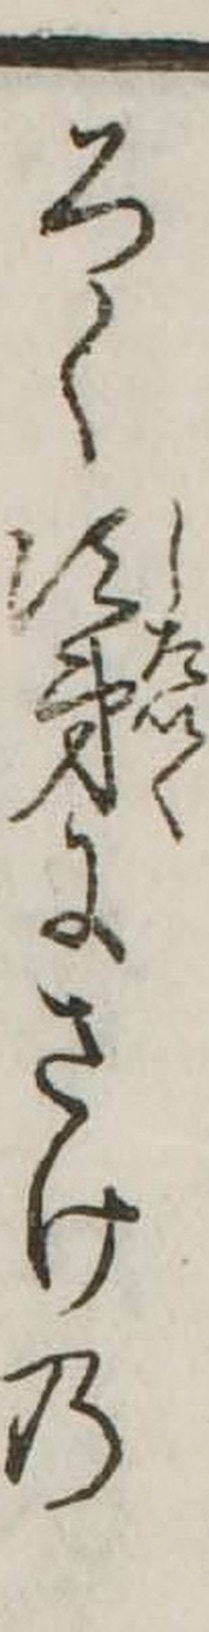ろく次第にさけの
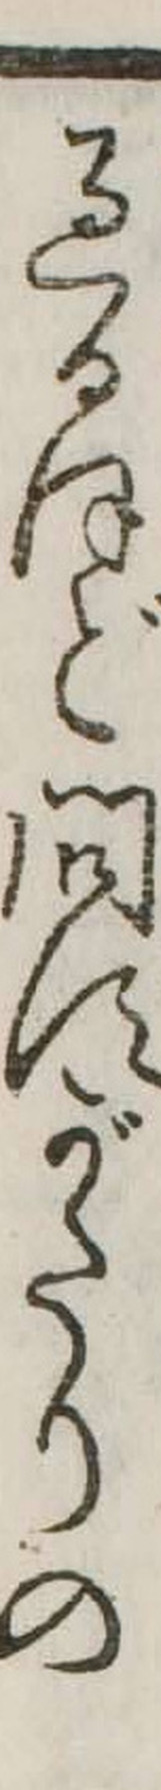過るほど問ずがたりの
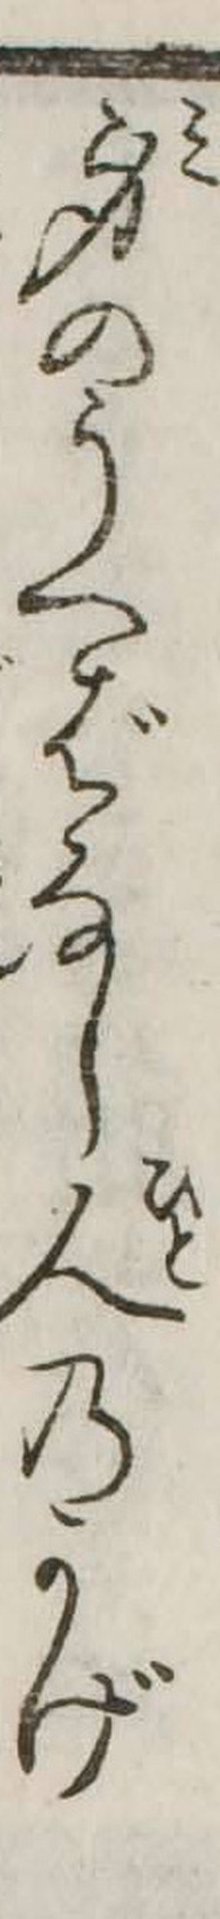身のうへばなし人のかげ
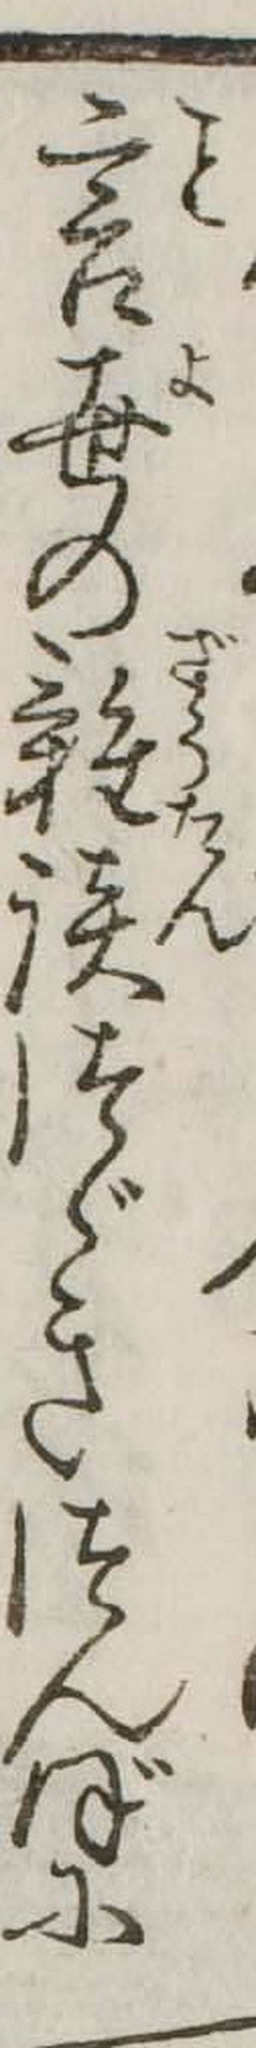言世の雑談つゞきつんぼに
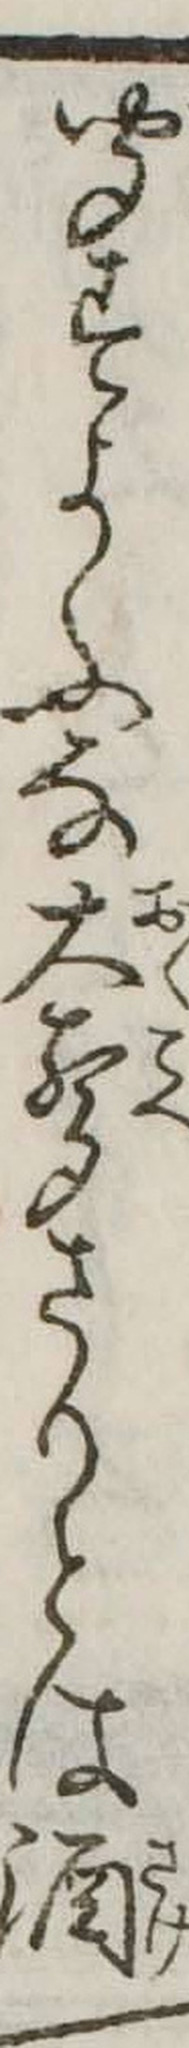聞すよふな大声さりとは酒
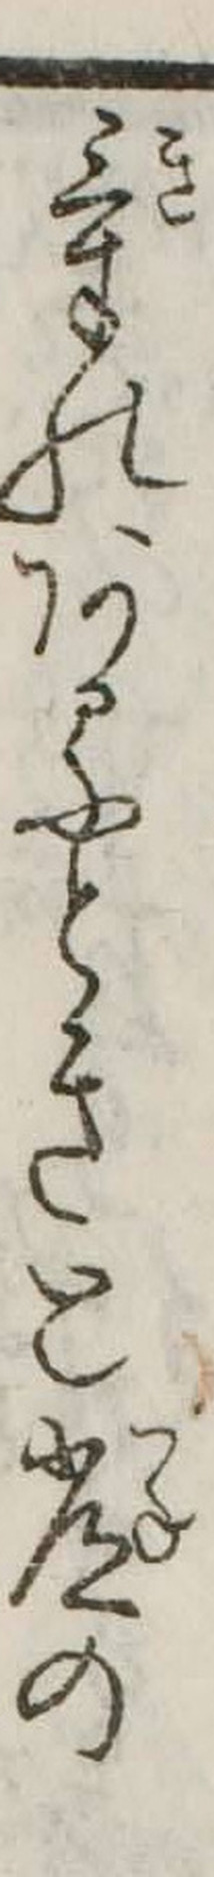気のあるときと常の
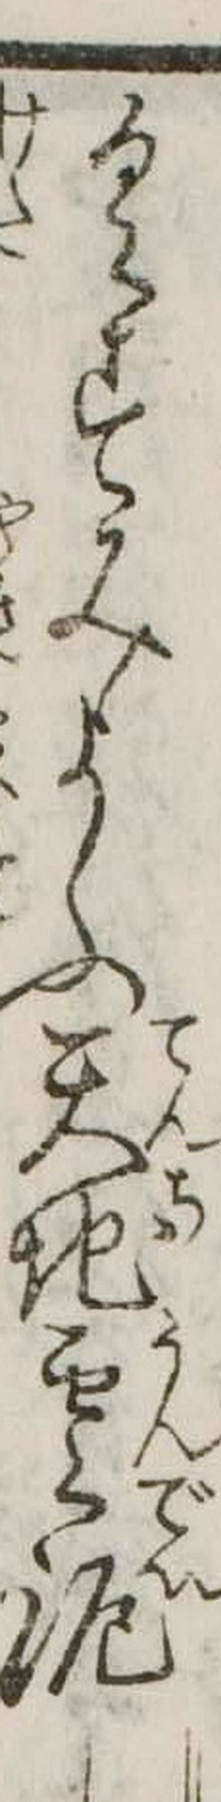くすみよふ天地雲泥
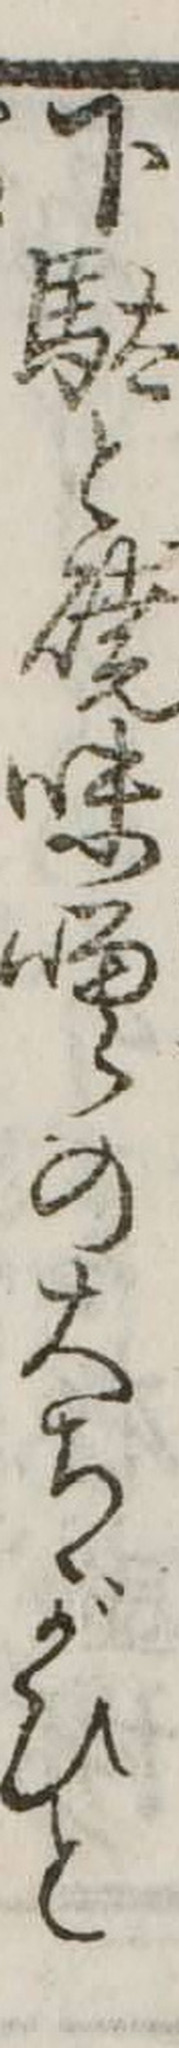下駄と焼味噌の大ちがひと
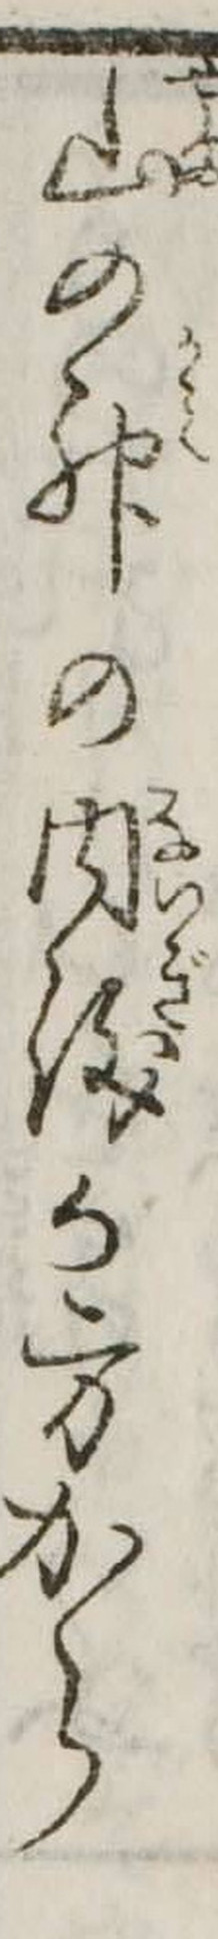山の神の内儀か方から
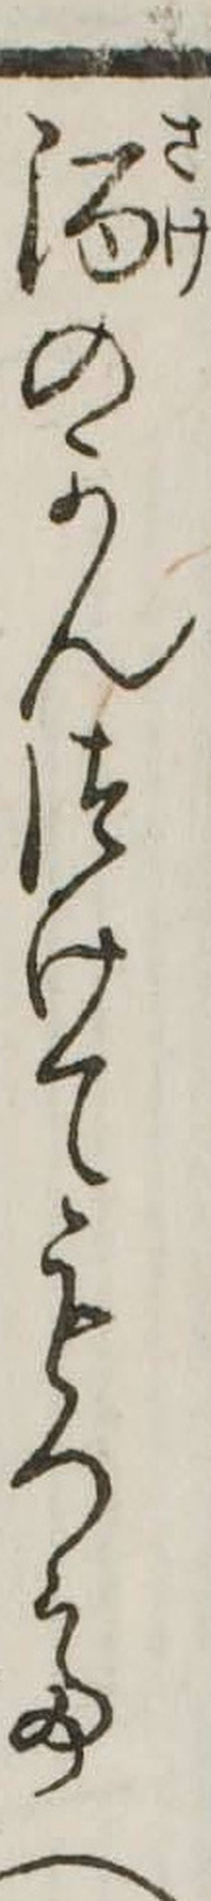酒のかんつけてもつて
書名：繪本不盡泉
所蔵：国文学研究資料館
